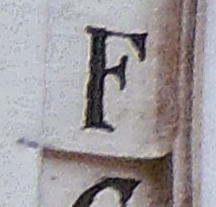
F
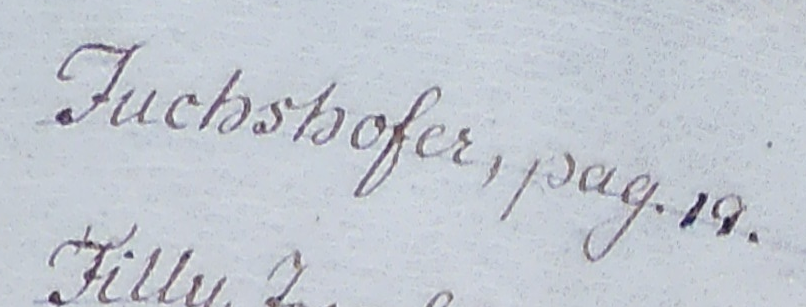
Fuchshofer, pag. 19.
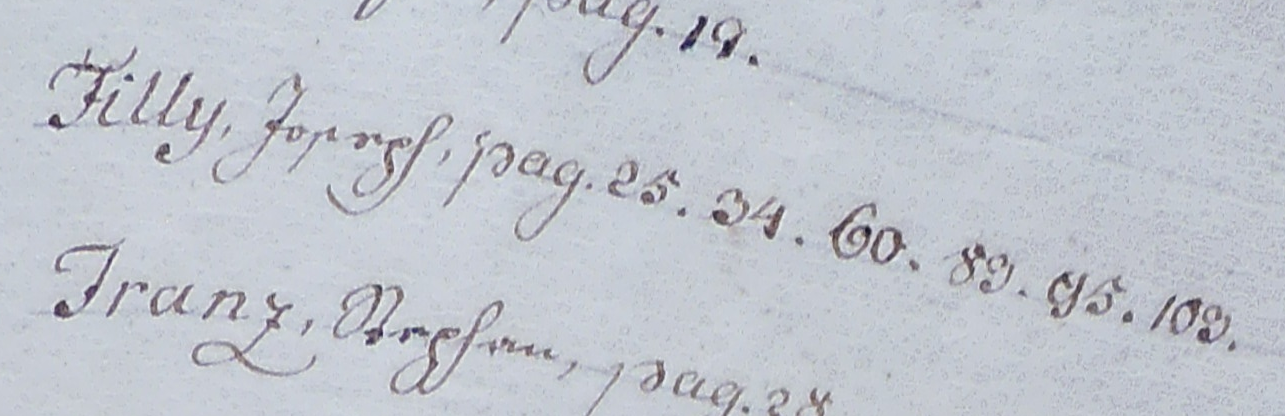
Filly, Joseph, pag. 25. 34. 60. 83. 95. 103.
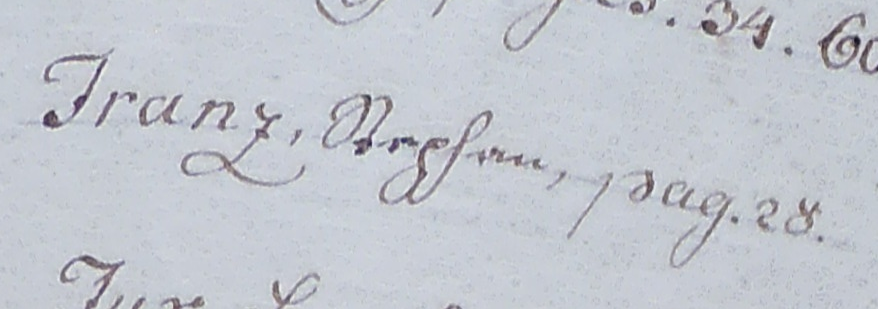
Franz, Stephan, pag. 28.
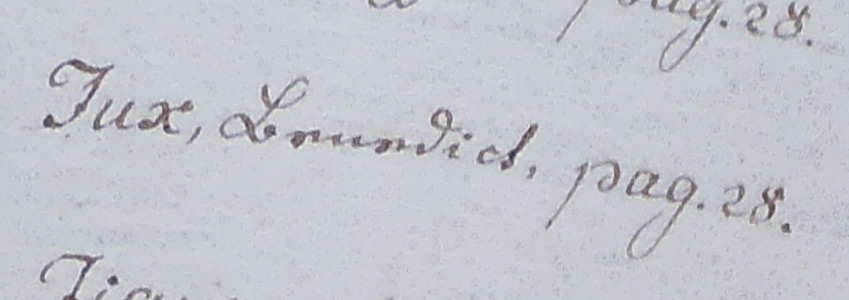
Fux, Benedict, pag. 28.
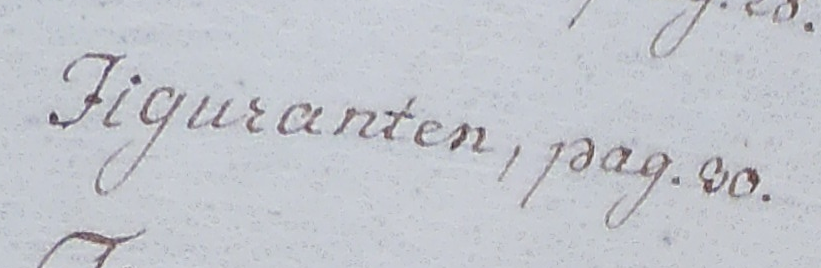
Figuranten, pag. 30.
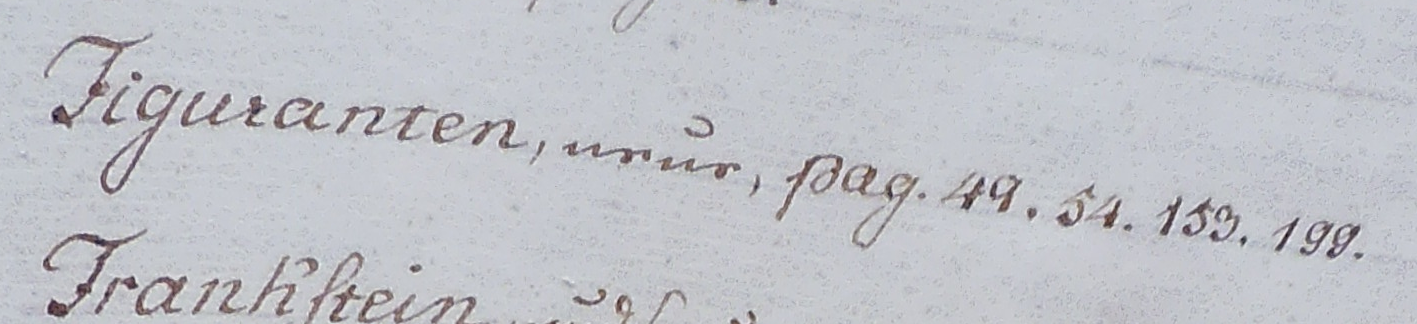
Figuranten, neue, pag. 49. 54. 153. 199.
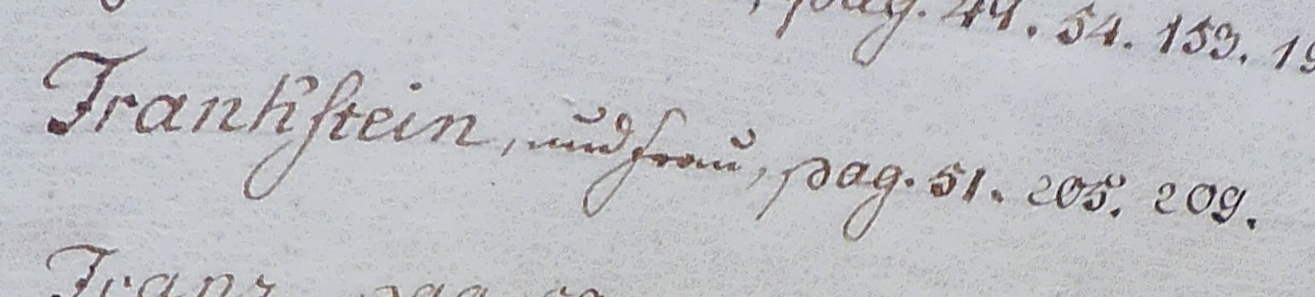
Frankstein, und Frau, pag. 51. 205. 209.
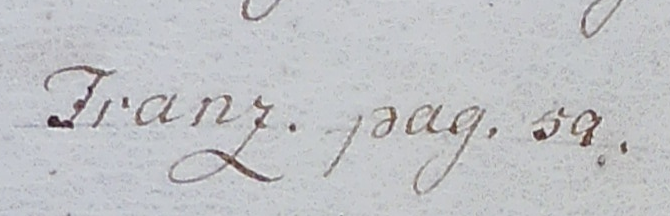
Franz. pag. 59.
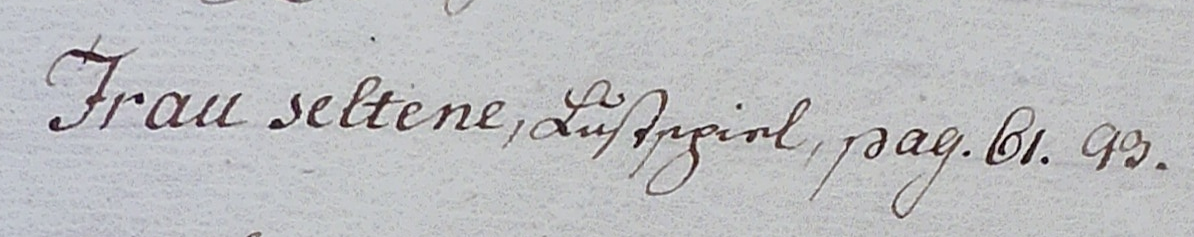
Frau seltene, Lustspiel, pag. 61. 93.
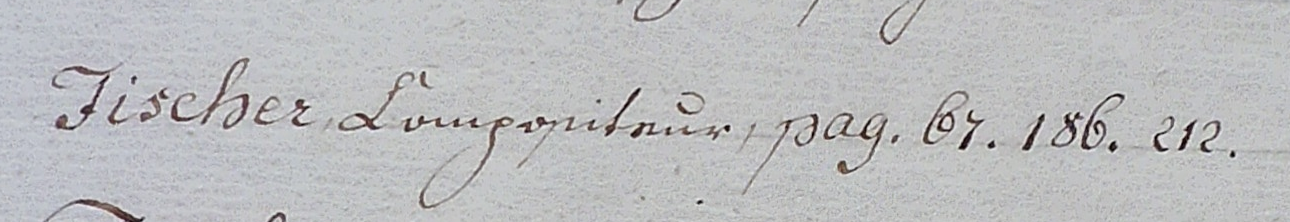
Fischer, Compositeur, pag. 67. 186. 212.
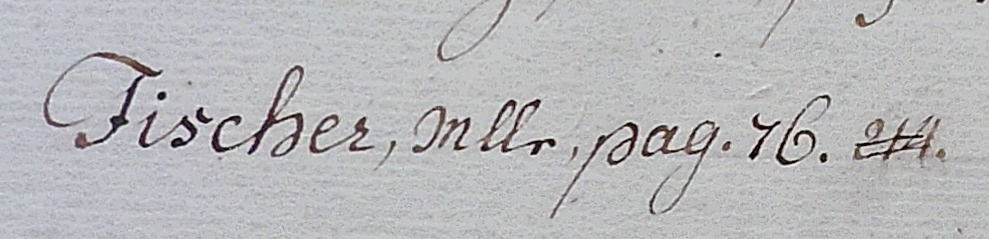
Fischer, Mlle. pag. 76. 214.
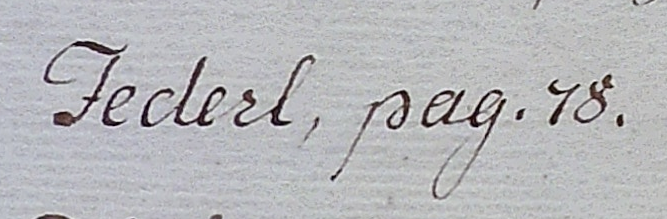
Federl, pag. 78.
